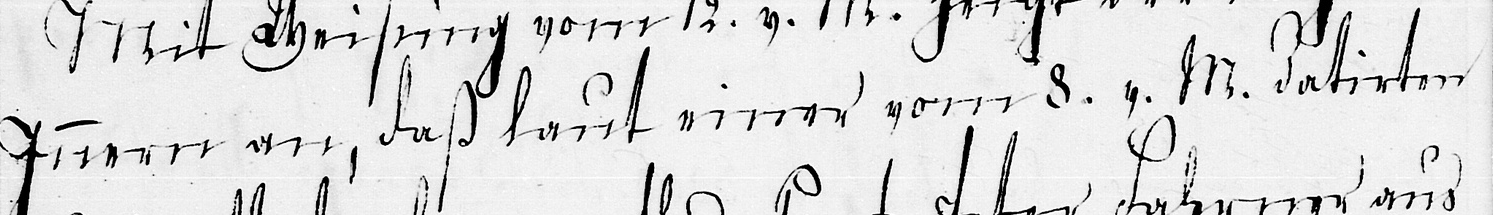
Innern an, daß laut einer vom 8. v. M. datirten
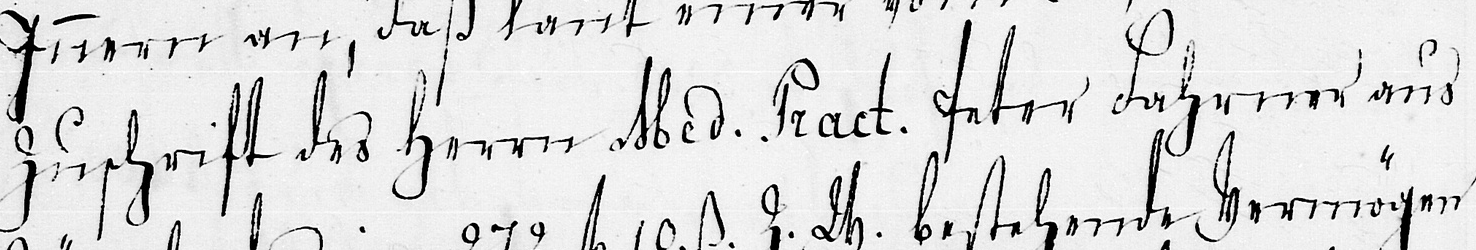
Zuschrift des Herrn Med. Pract. Peter Fahrner aus
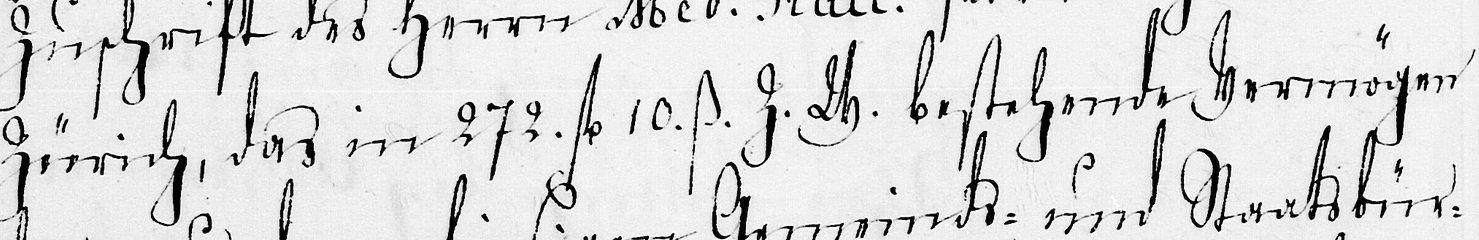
Zürich, das in 272. fl. 10. ß. Z. V. bestehende Vermögen
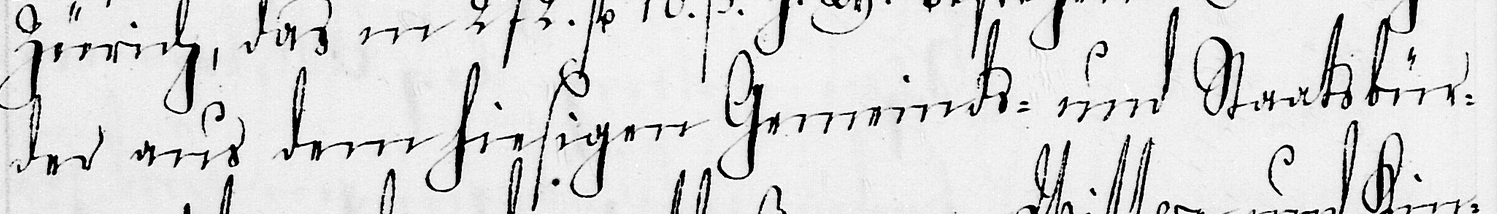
der aus dem hiesigen Gemeinds- und Staatsbür¬
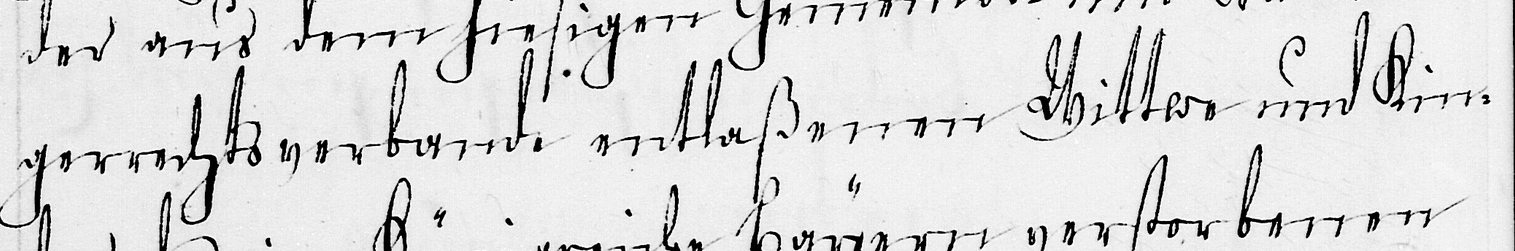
gerrechtsverbande entlaßenen Wittwe und Kin¬
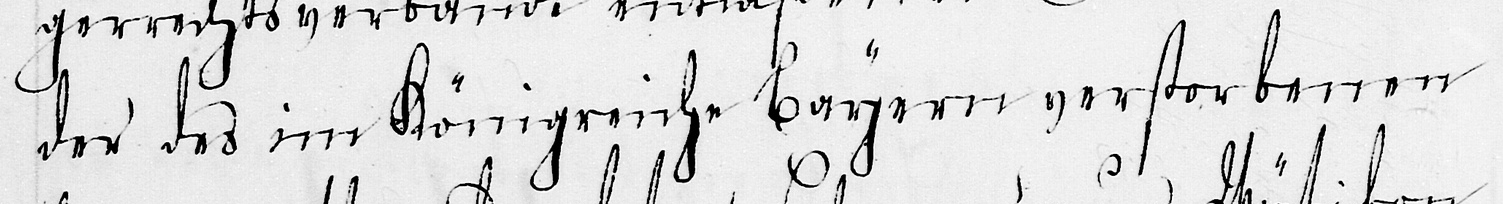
der des im Königreiche Bayern verstorbenen
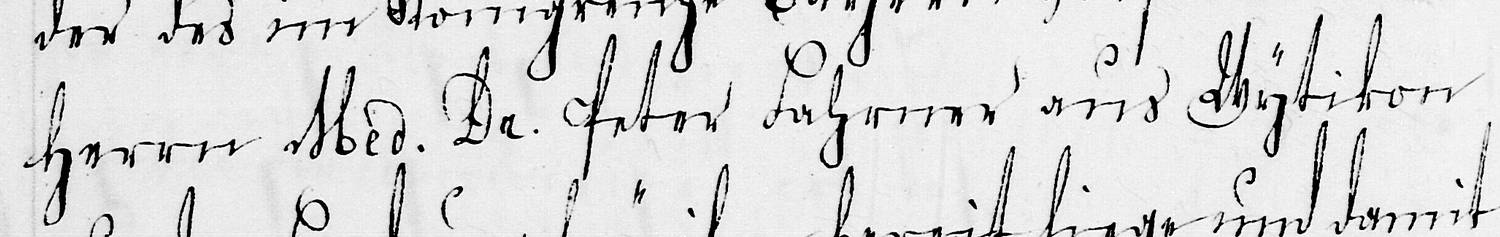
Herrn Med. Dr. Peter Fahrner aus Wytikon
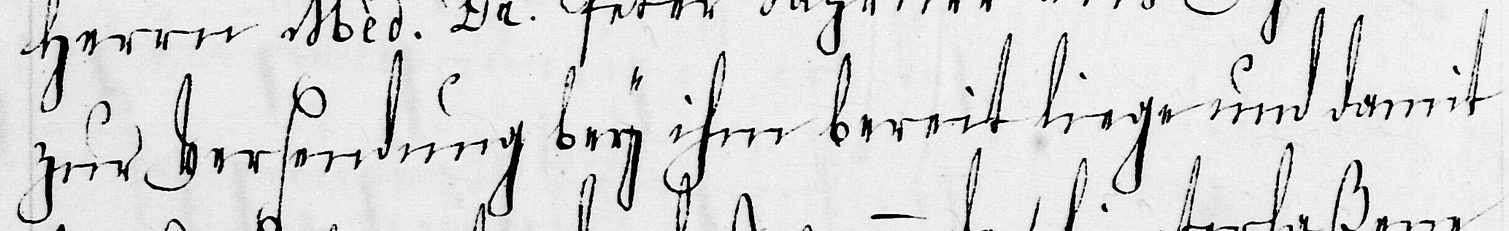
zur Versendung bey ihm bereit liege und damit
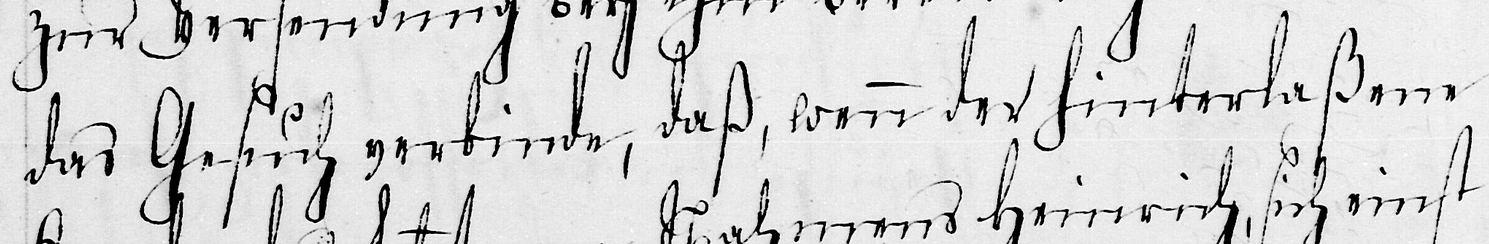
das Gesuch verbinde, daß, wenn der hinterlaßene
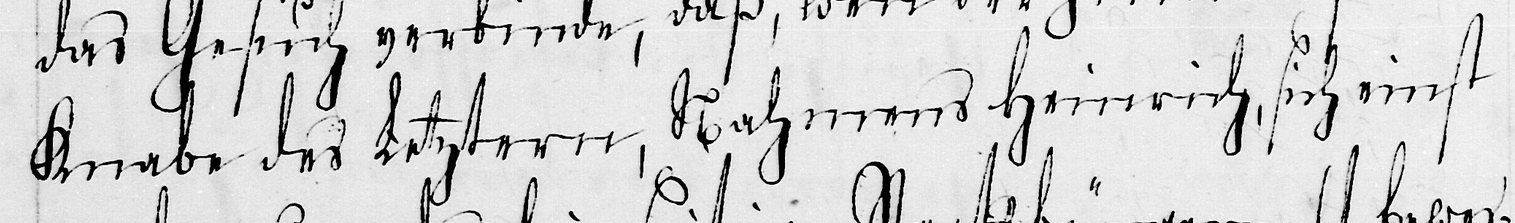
Knabe des Letztern, Nahmens Heinrich, sich einst
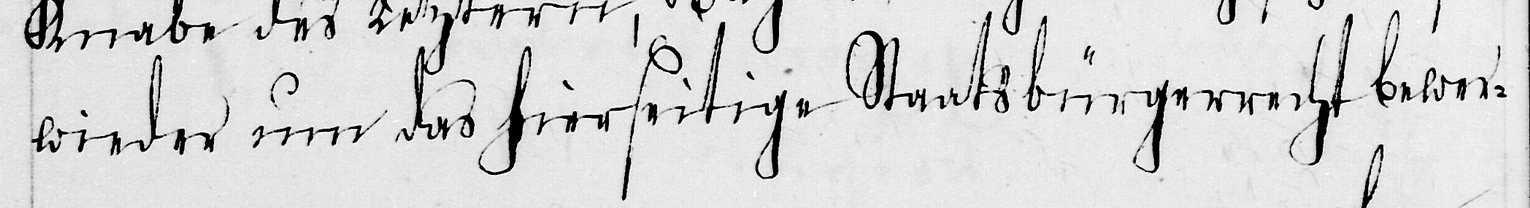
wieder um das hierseitige Staatsbürgerrecht bewer-
